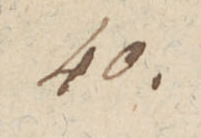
40.
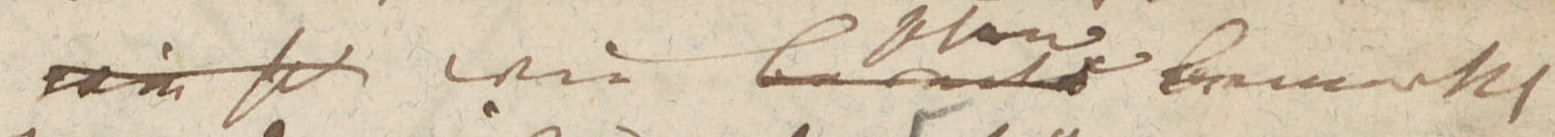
wie sc wie bereits schon bemerkt
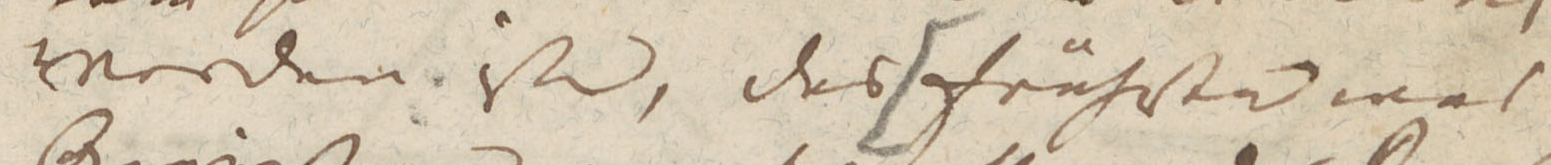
worden ist, das % früheste was
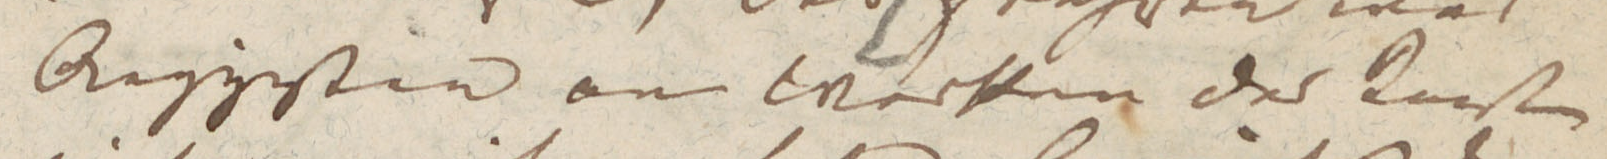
Aegypten an Werken der Kunst
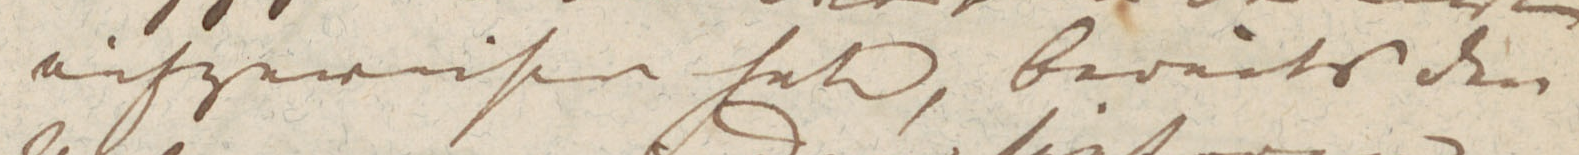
aufzuweisen hat, bereits den
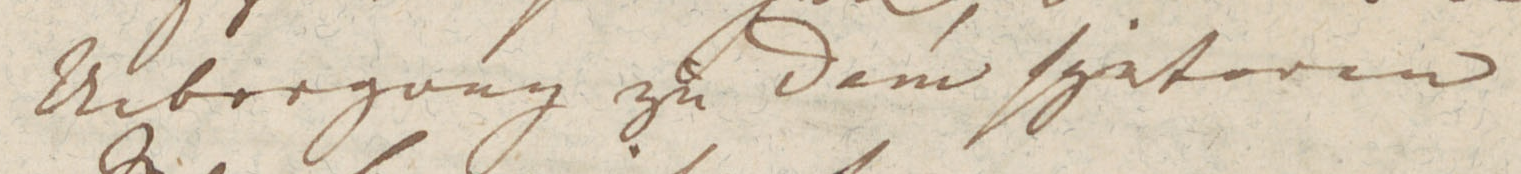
Uebergang zu dem späteren
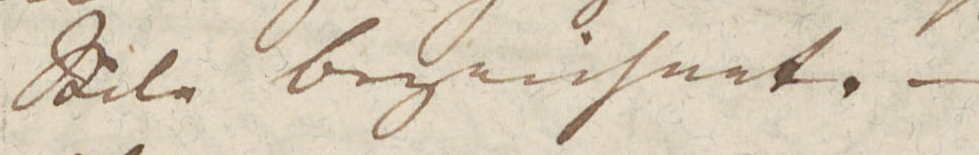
Stile bezeichnet. – .
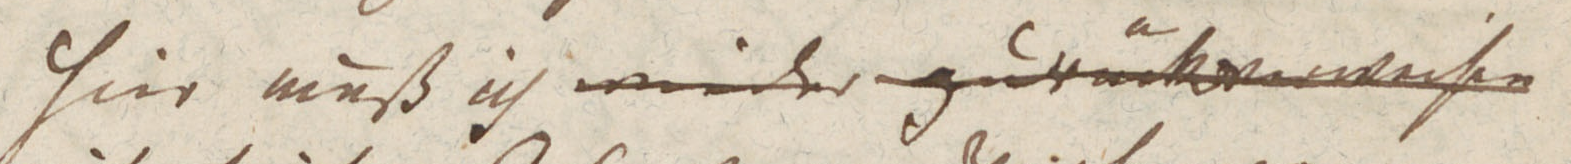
Hier muss ich wieder zurückverweisen
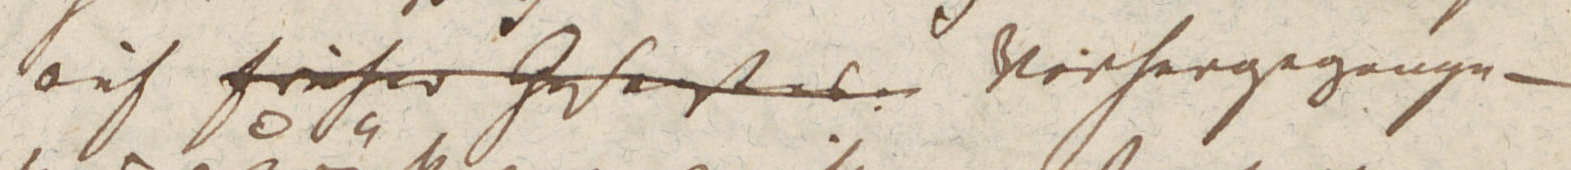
auf früher Gesagtes Vorhergegange-
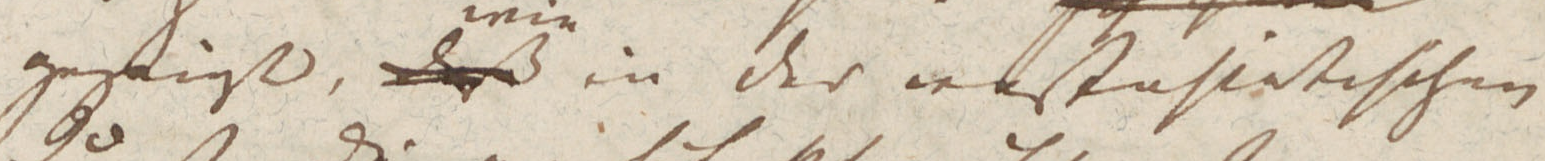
gezeigt, dass wie in der westasiatischen
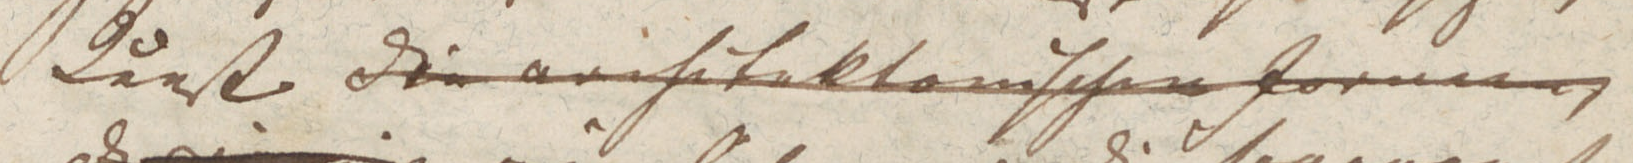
Kunst die architektonischen Formen
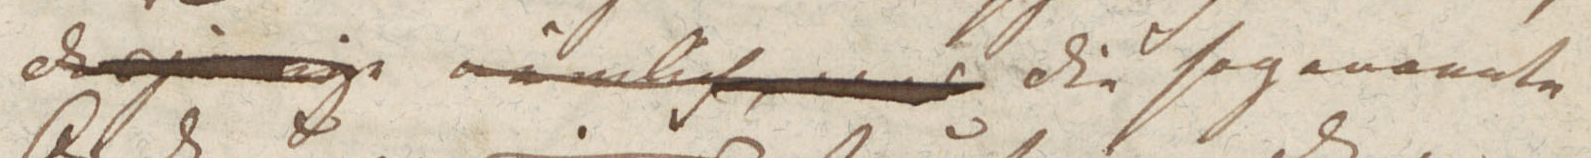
dasjenige nämlich, was die sogenannte
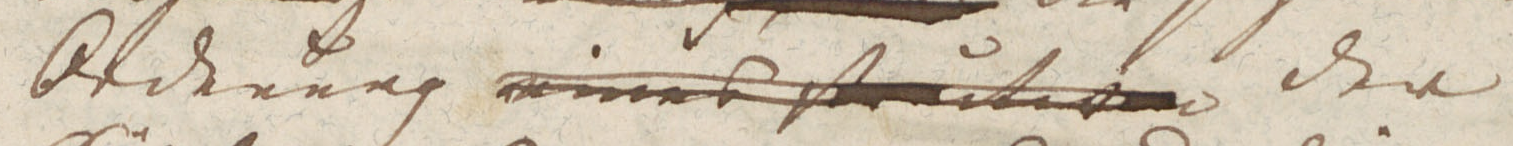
Ordnung eines structiven der
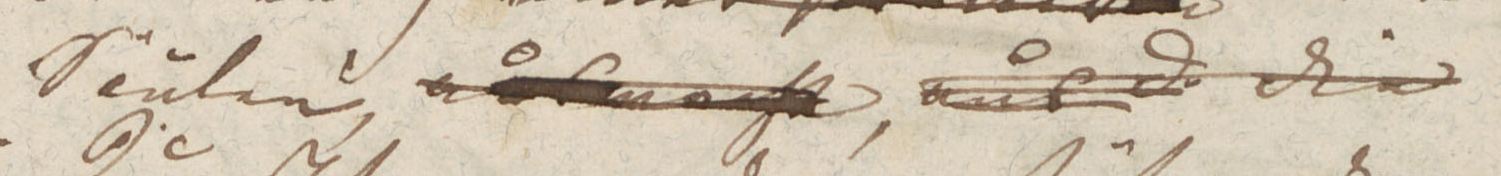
Säulen, ausmacht, aus d die
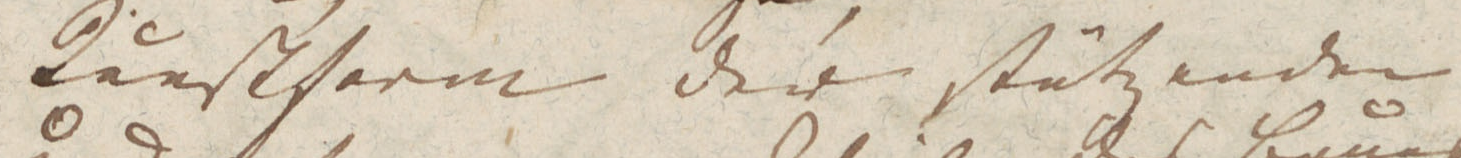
Kunstform der stützenden
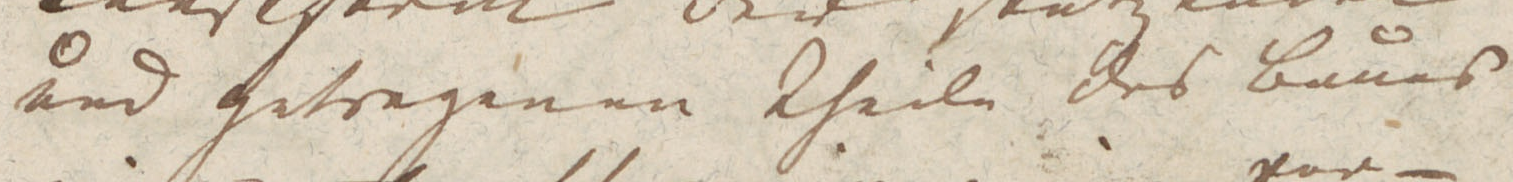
und getragenen Theile des Baues
